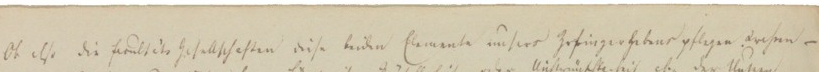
Facultäts Gesellschaften diese beiden Elemente unsers Zofingerlebens pflegen &
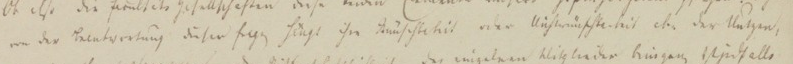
von der Beantwortung dieser Frage hängt ihre Wünschbarkeit oder Nichtwünschbarkeit ab. Der Nutzen,
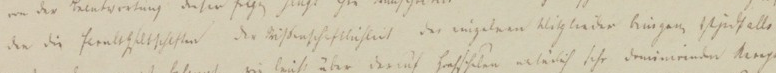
den die FacultGesellschaften der Wissenschaftlichkeit der einzelnen Mitglieder bringen, ist jedfalls
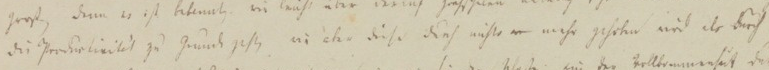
die Productivität zu Grunde geht, wie aber diese durch nichts mehr gehoben wird als durch
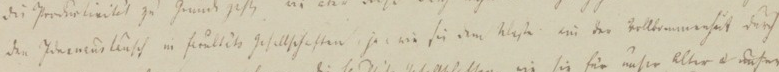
den Ideenaustausch in Facultäts Gesellschaften, ja, wie sie dem Maße & in der Vollkommenheit durch
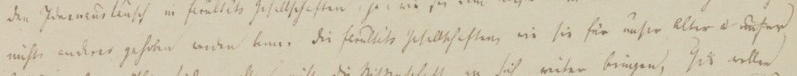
nichts anderes gehoben werden kann. Die Facultäts Gesellschaften, wie sie für unser Alter & unser
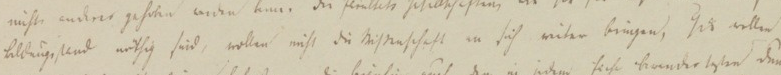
Bildungsstand nöthig sind, wollen nicht die Wissenschaft an sich weiter bringen, sie wollen
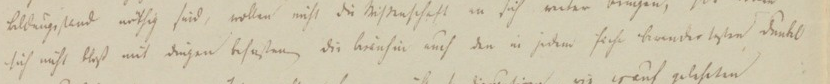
sich nicht bloß mit Dingen befassen, die bisanhin auch den in jedem Fache Bewandertsten dunkel
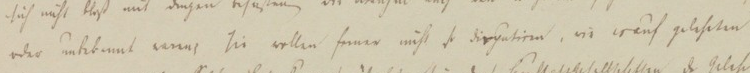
oder unbekannt waren, sie wollen ferner nicht so disputiren, wie es auf gelehrten
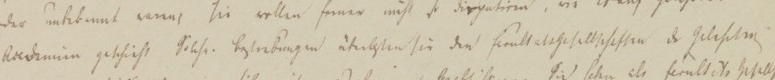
Academien geschieht. Solche Bestrebungen überlassen sie den Facultätsgesellschaften der Gelehrten,
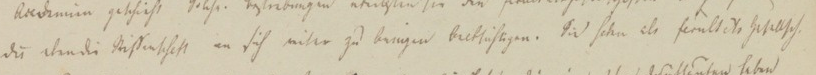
die eben die Wissenschaft an sich weiter zu bringen beabsichtigen. Sie haben als FacultätsGesellsch.
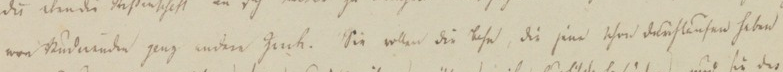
von Studirenden ganz andere Zwecke. Sie wollen die Bahn, die jene schon durchlaufen haben
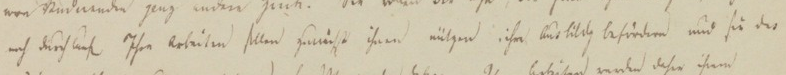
noch durchlaufen. Ihre Arbeiten sollen zunächst ihnen nützen, ihre Ausbildg befördern und sie das
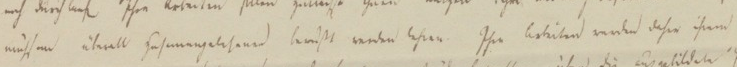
mühsam überall zusammengelesene bewußt werden lassen. Ihre Arbeiten werden daher ihrem
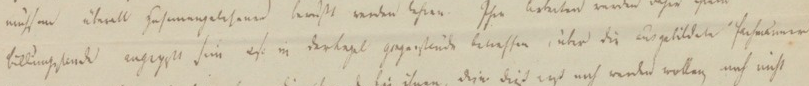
Bildungsstande angepaßt sein & so in der Regel Gegenstände betreffen, über die ausgebildete Fachmänner
